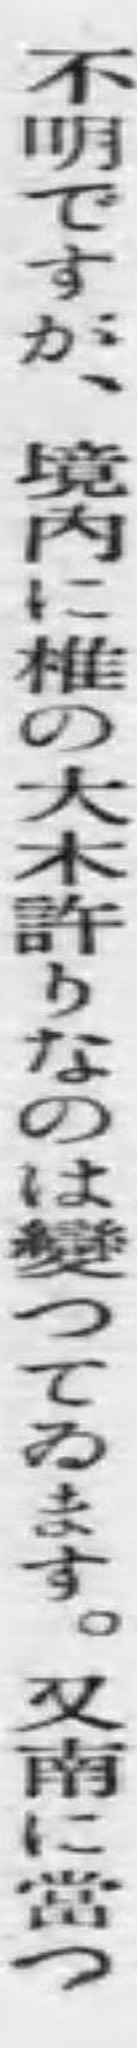不明ですが、境内に椎の大木許りなのは変つてゐます。又南に当つ
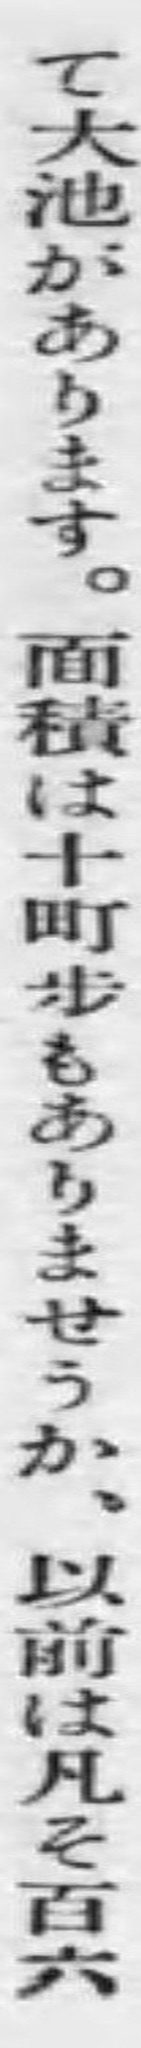て大池があります。面積は十町歩もありませうか、以前は凡そ百六
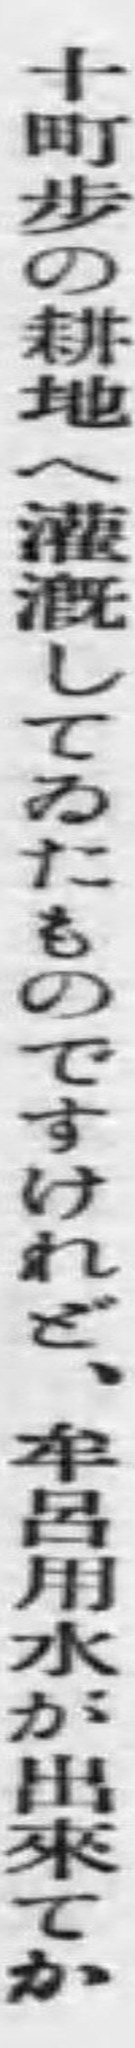十町歩の耕地へ灌漑してゐたものですけれど、牟呂用水が出来てか
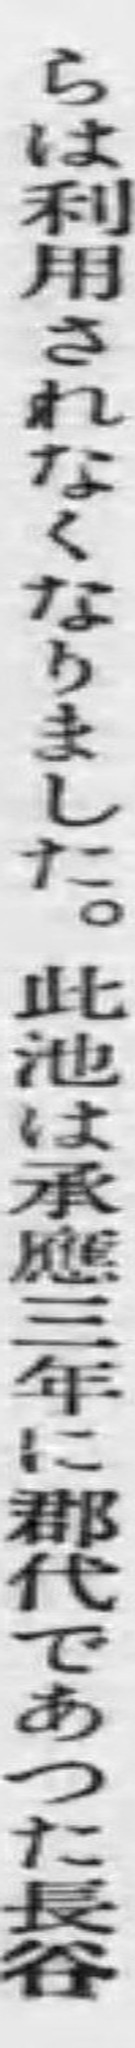らは利用されなくなりました。此池は承応三年に郡代であつた長谷
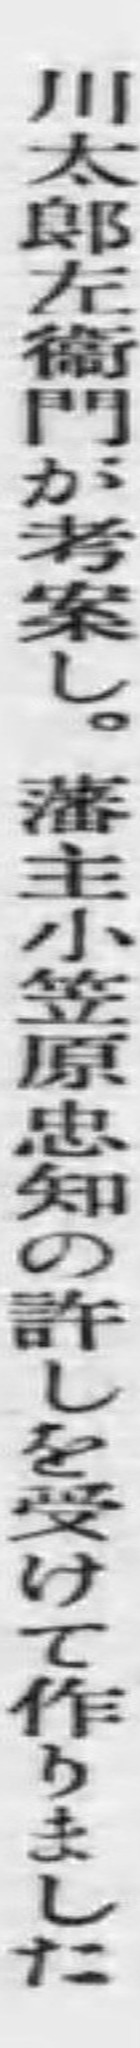川太郎左衛門が考案し。藩主小笠原忠知の許しを受けて作りました
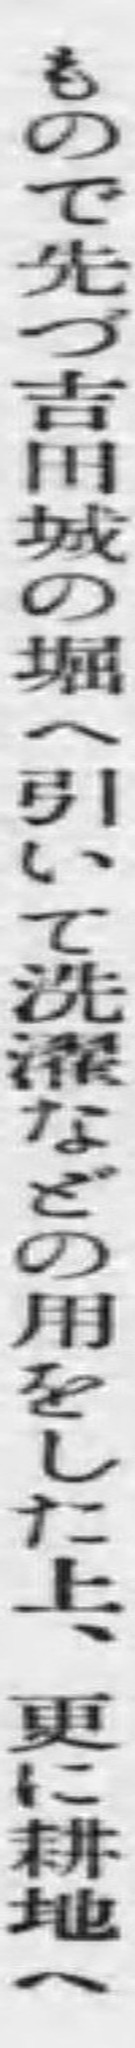もので先づ吉田城の堀へ引いて洗濯などの用をした上、更に耕地へ
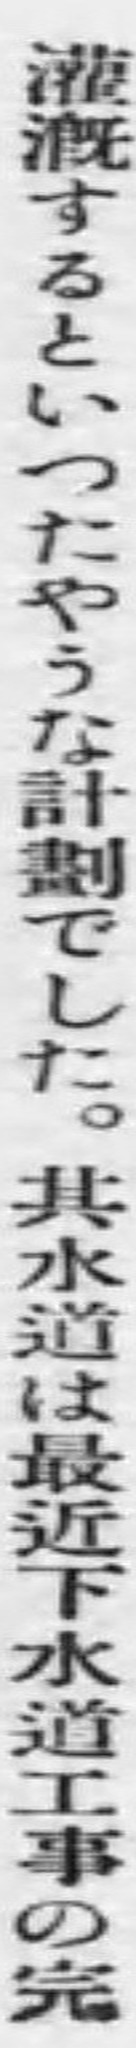灌漑するといつたやうな計画でした。其水道は最近下水道工事の完
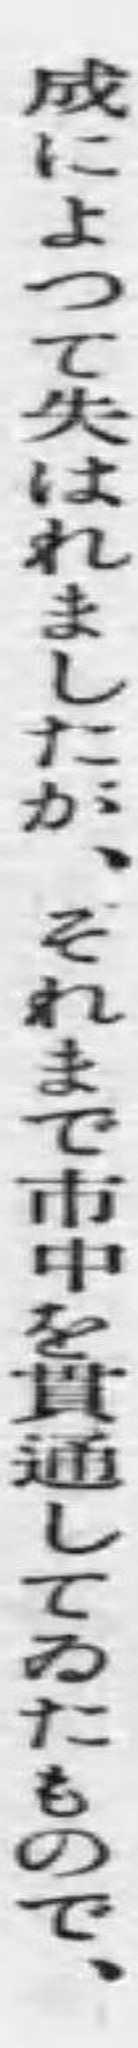成によつて失はれましたが、それまで市中を貫通してゐたもので、
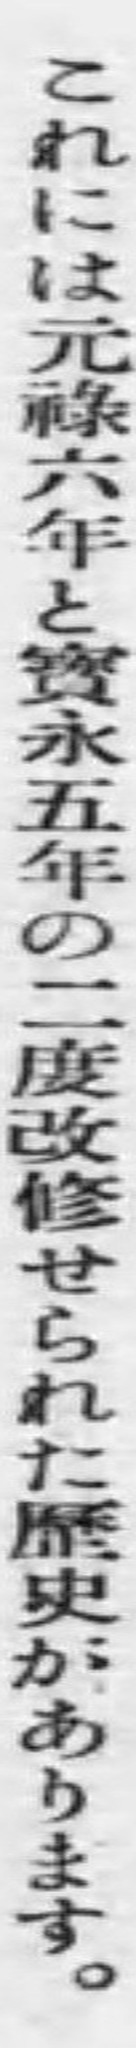これには元禄六年と宝永五年の二度改修せられた歴史があります。
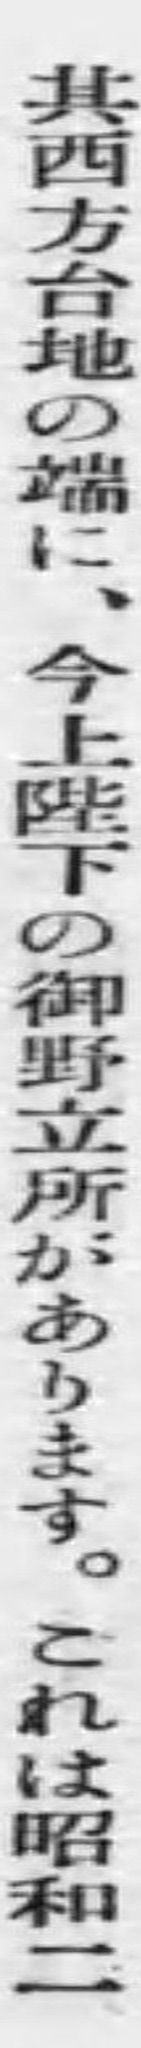其西方台地の端に、今上陛下の御野立所があります。これは昭和二
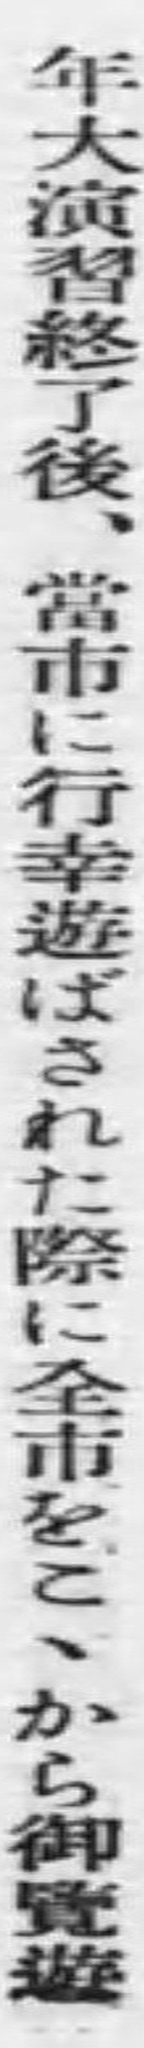年大演習終了後、当市に行幸遊ばされた際に全市をこゝから御覧遊
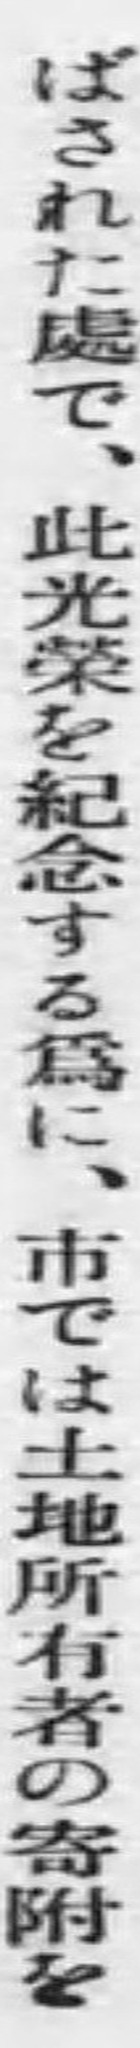ばされた処で、此光栄を紀念する為に、市では土地所有者の寄附を
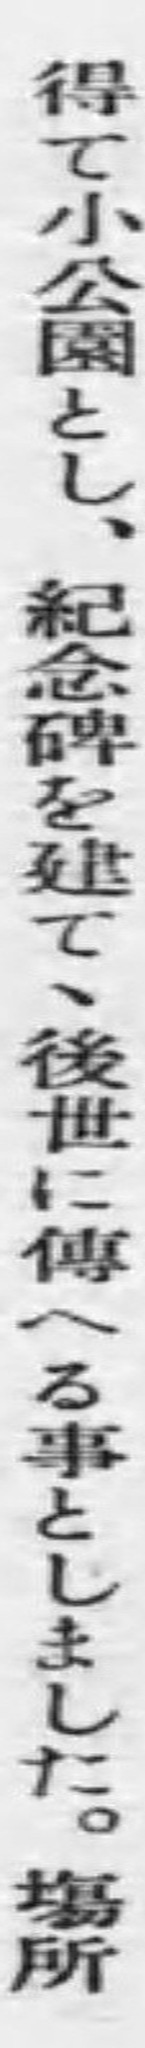得て小公園とし、紀念碑を建てゝ後世に伝へる事としました。場所
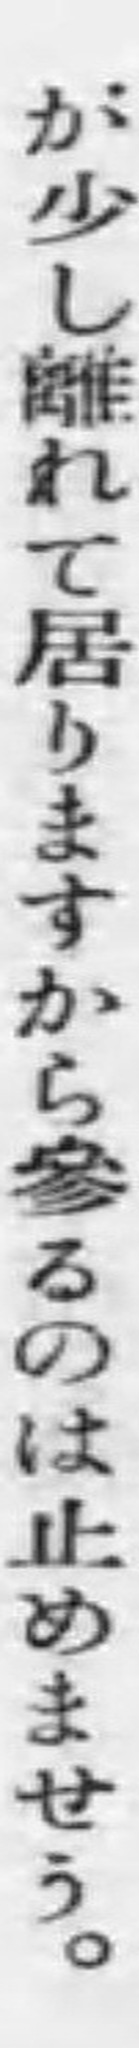が少し離れて居りますから参るのは止めませう。

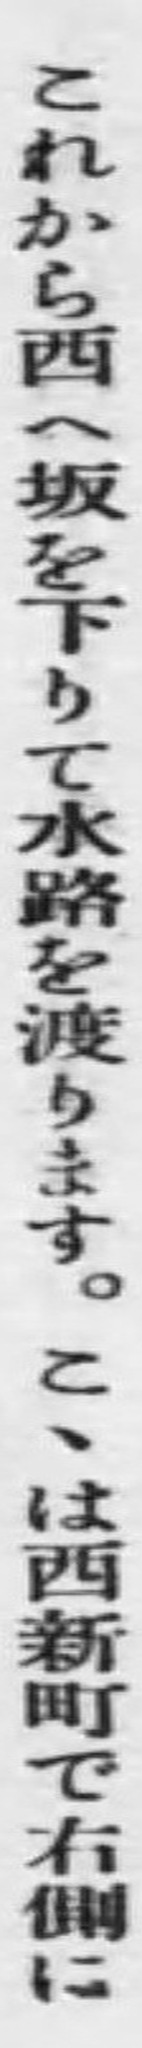これから西へ坂を下りて水路を渡ります。こゝは西新町で右側に
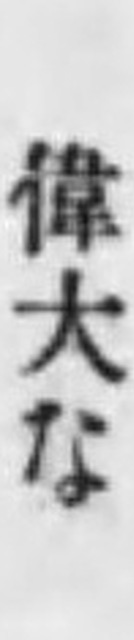偉大な
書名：東三河道中記 : 豊橋市及其附近案内
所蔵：国立国会図書館 National Diet Library, JAPAN
